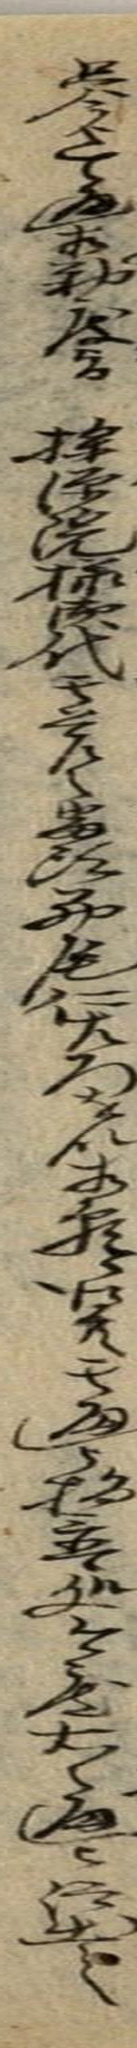只今迄之通相勤度旨探源院様御代其節之番頭西尾仁左衛門を以相願候得共其通被指置候処今度右之通被仰出之

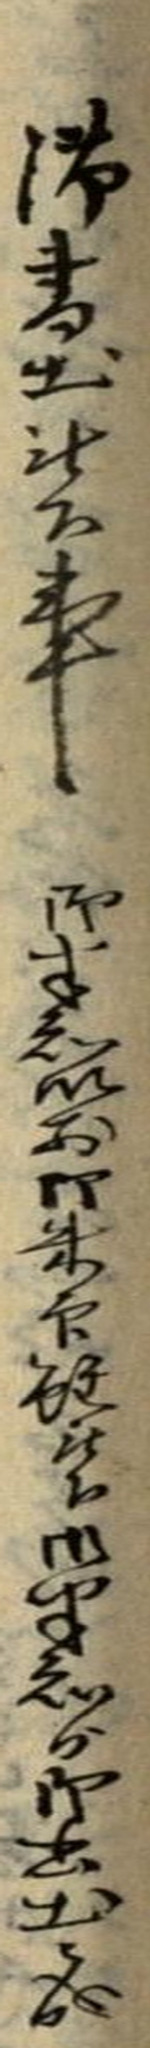御書出被下事御半知以前御朱印雖被下御半知ゟ御書出被成
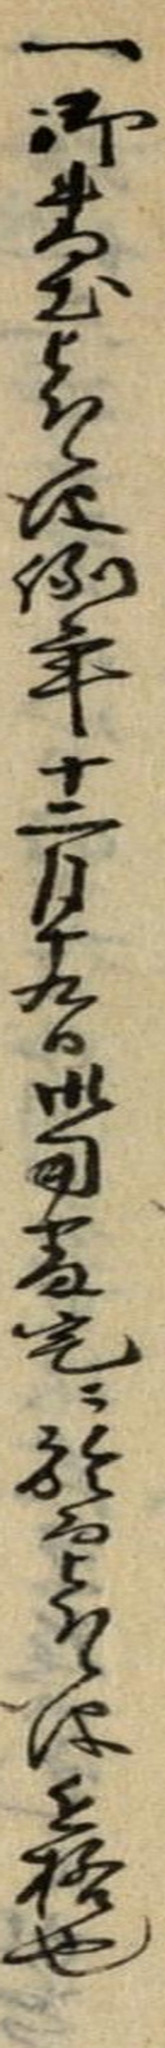一御書出被下候儀例年十二月十九日御用番宅に於而被下候儀近格也
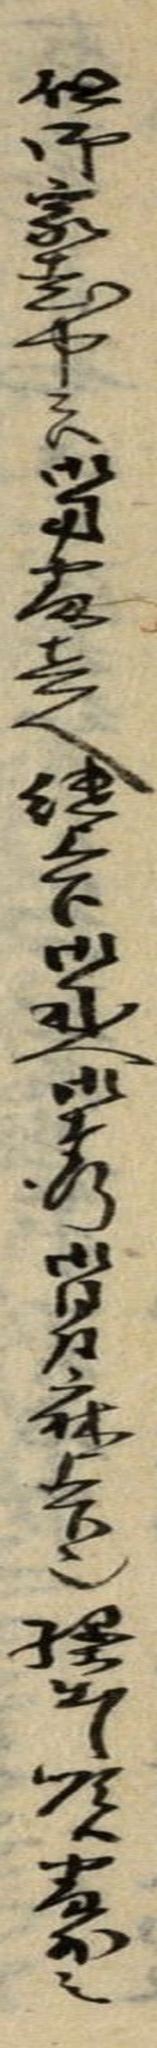但御家老中には御用番壱人継上下御用人御奉行御目付麻上下也繰出し順は番外之
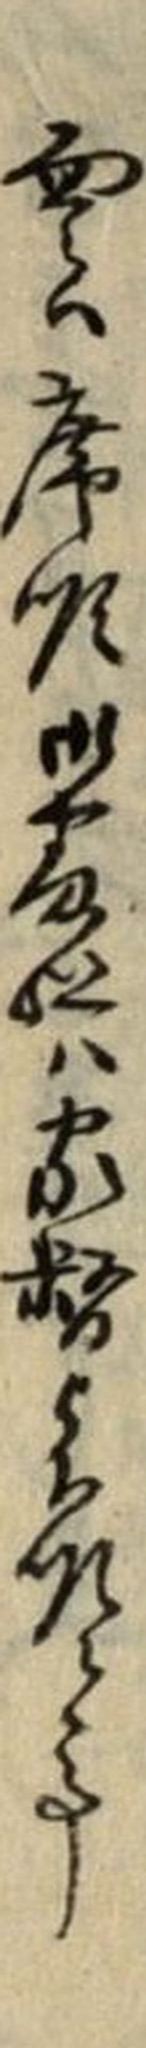面々は席順御番組は家督被下順に候事
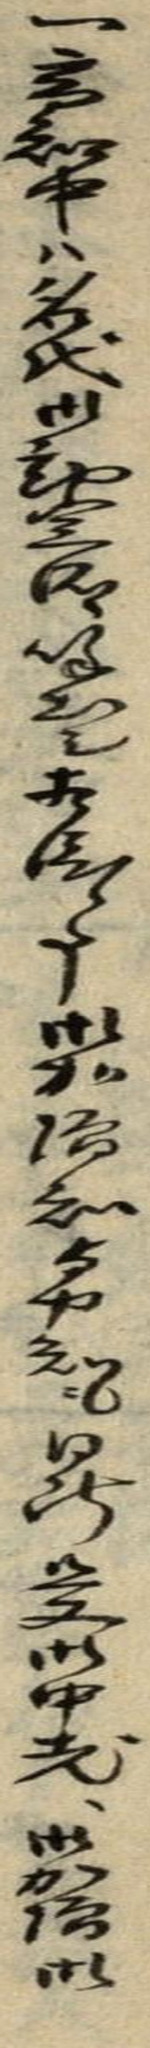一高知中は名代御勘定所へ呼出し相渡候事御加増知与力知も同断且又御中老へ御加増御
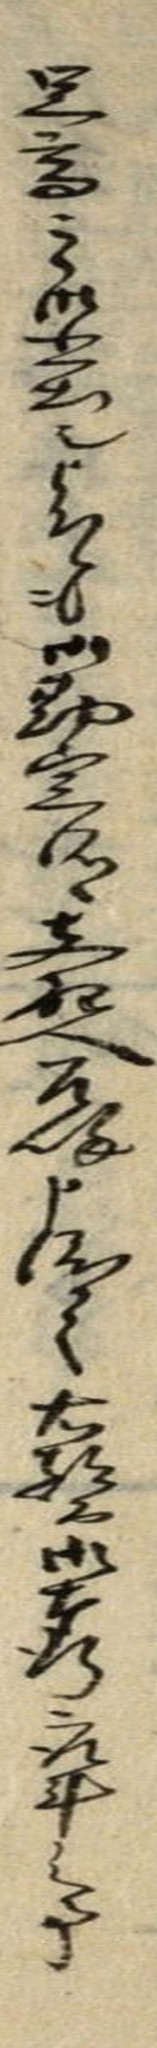足高之御書出し被下候も御勘定所へ支配人召呼申渡之右都而御奉行取斗候事
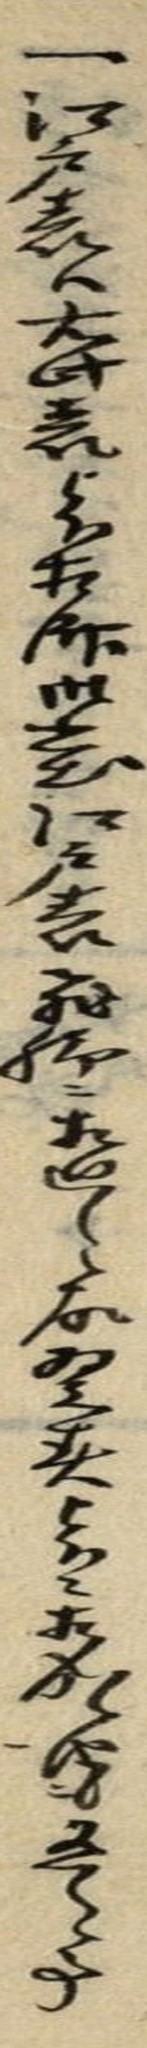一江戸表は右此表被下相済御書出江戸表飛脚に相廻し候故翌春被下に相成候儀も有之候事
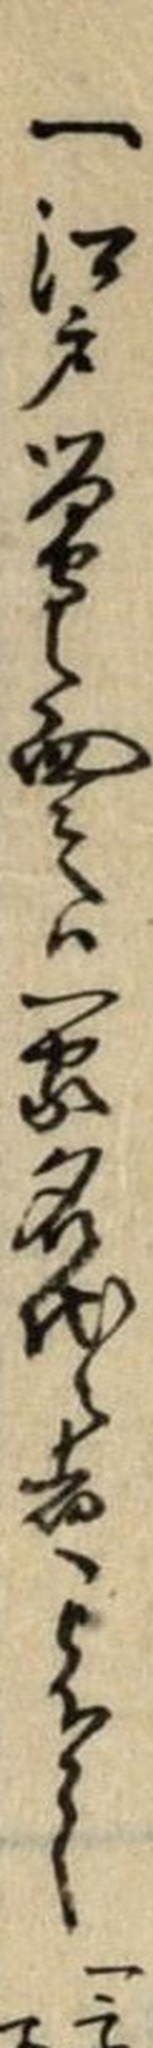一江戸留守之面々へは一家名代之者へ被下之
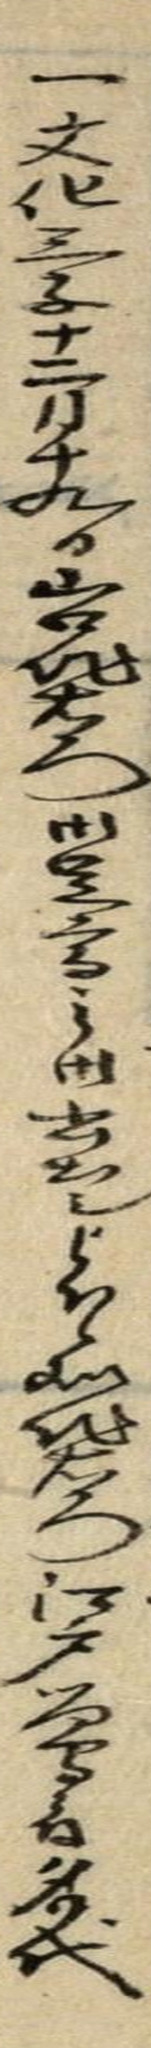一文化三子十二月十九日山口作右衛門御足高之御書出し被下候処作右衛門江戸留守に付名代
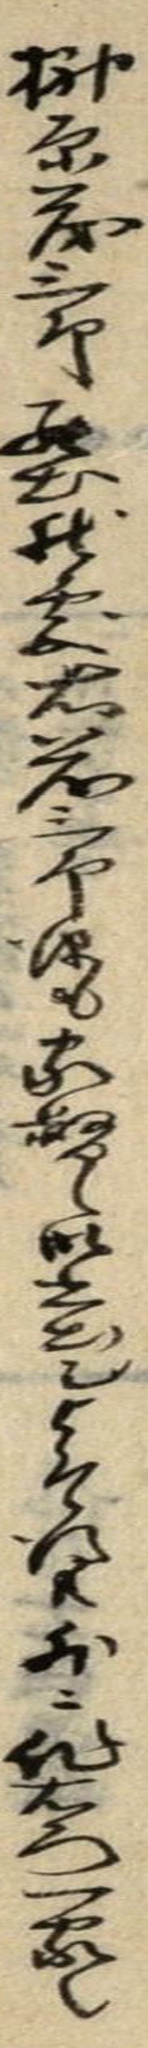榊原茂三郎罷出然処右茂三郎儀も家督之御書出し被下候得共外に作右衛門一家之
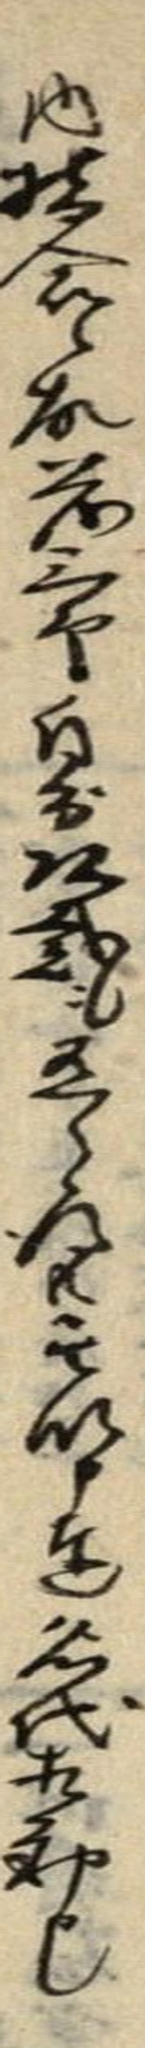内指合候故茂三郎自分頂戴も有之候得共其段申達名代相勤申候
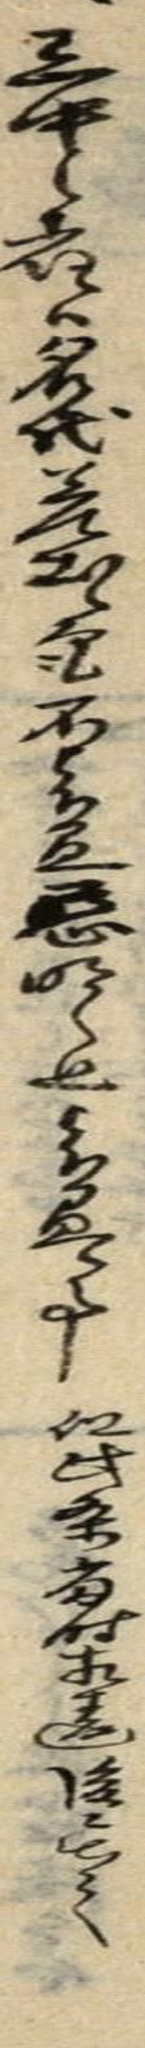一忌中之者へは名代差出候而も不被下置忌明候上被下置候事但此条当時相違後に出之
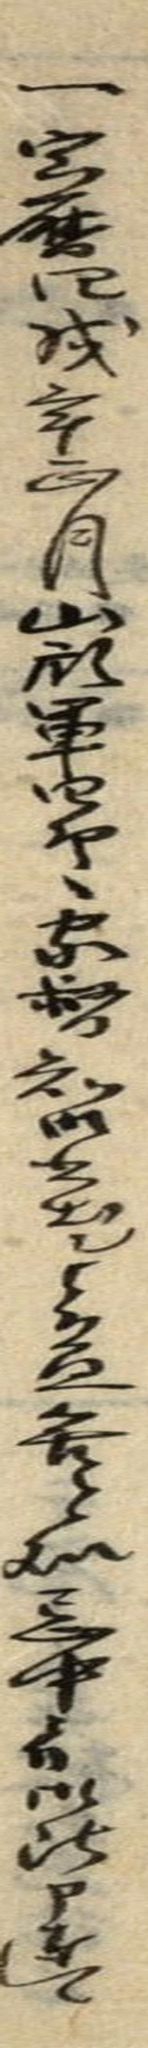一宝暦四戌年正月山形軍四郎へ家督知御書出し被下置筈之処忌中に付御断申達候
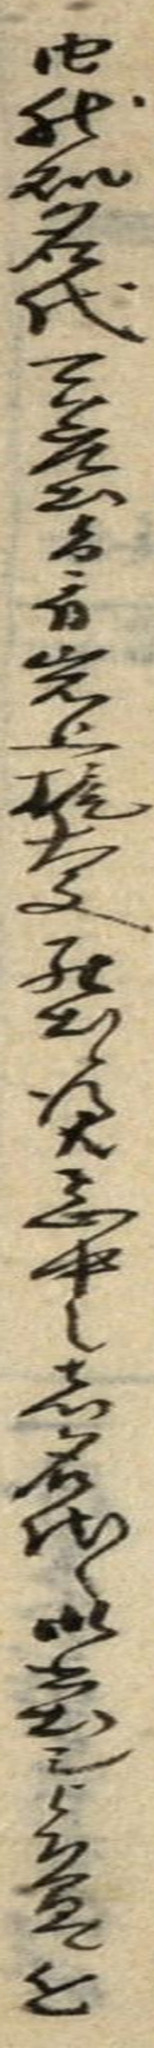由然処名代可差出旨に付岩上梶太夫罷出候得共忌中之者名代へ御書出し被下置候近
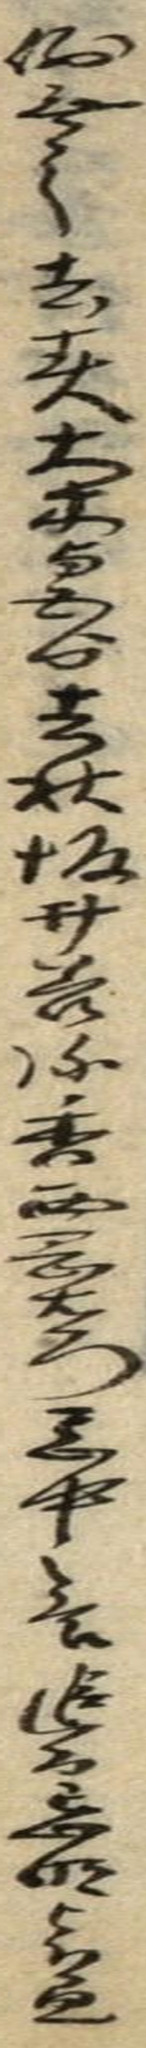例無之去春大木与五右衛門去秋坂井善弥香西岡右衛門忌中之節追而忌明被下置
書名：御用并被仰出之部
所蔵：福井県文書館 Fukui Prefectural Archives
